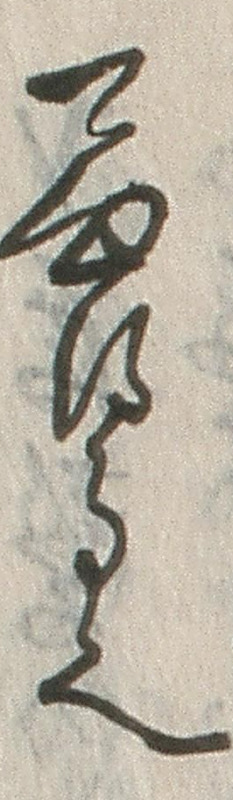可心得事也
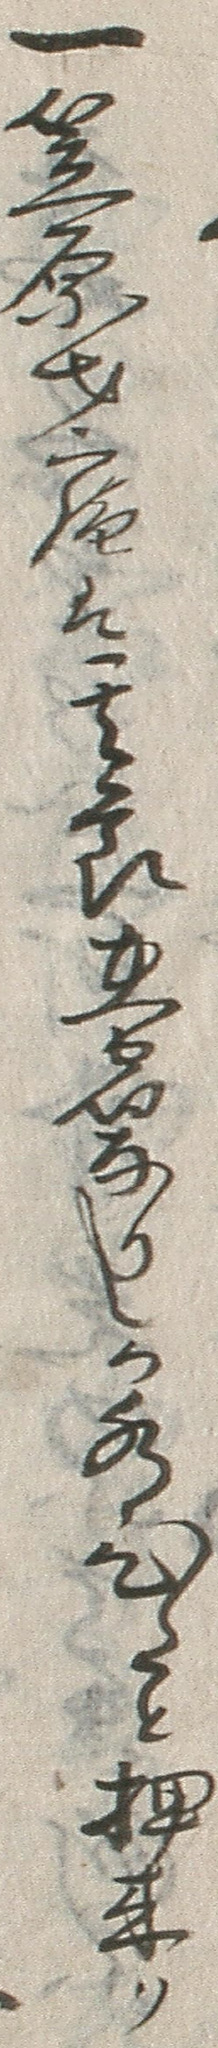一笠原才庵は其節在宿なりしか水ひたと押来り
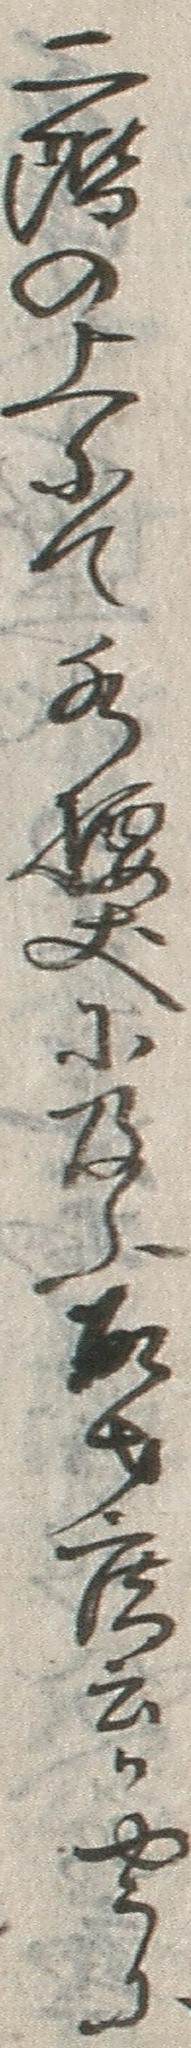二階の上にて水腰丈に及ふ故才庵云かやうに
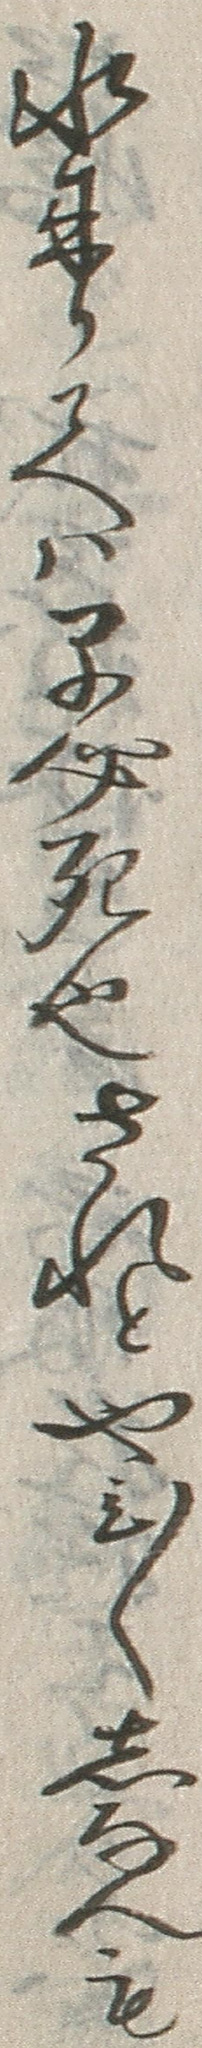水来りては早必死也されとやひ〳〵しなんも

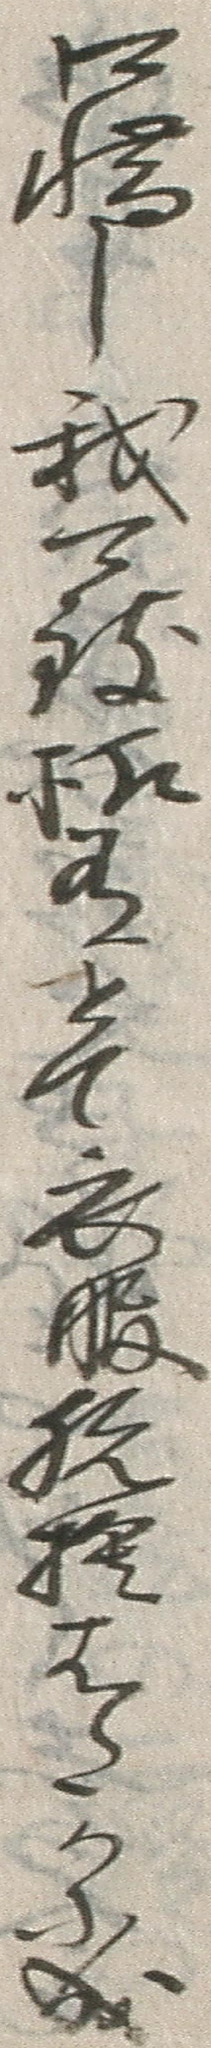口惜し我可致様有とて衣服脱捨はたかに成
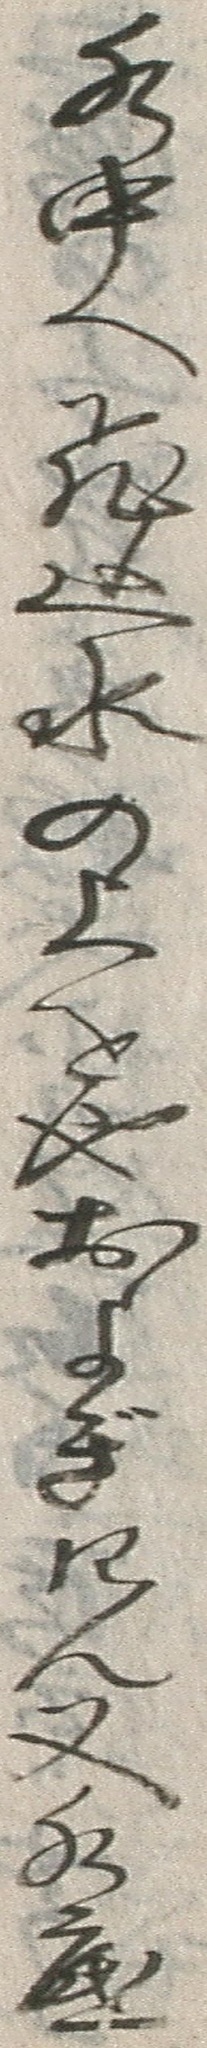水中へ飛込水の上をやおよぎけん又水底
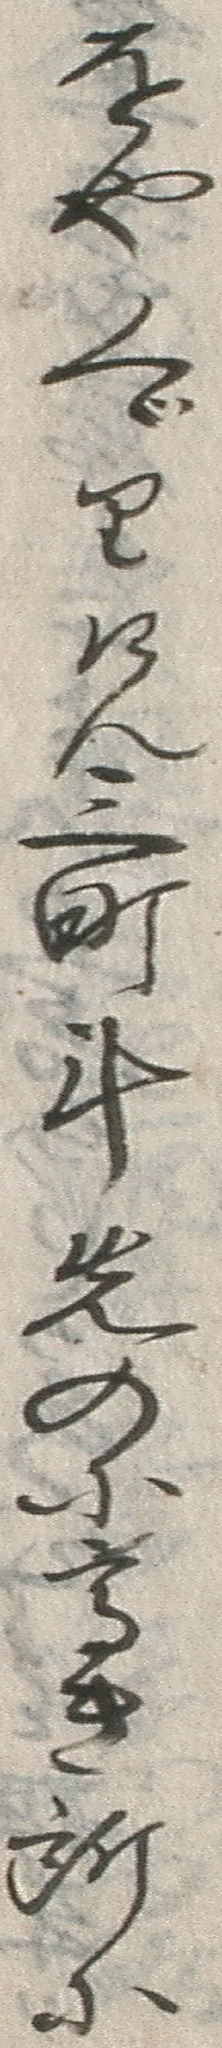をやくゞりけん三町斗先の小高き所に
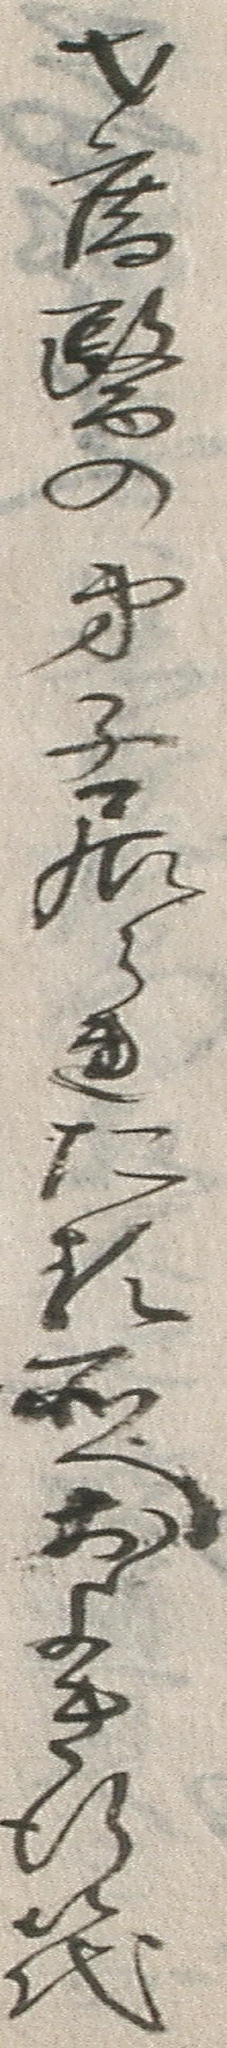才庵医の弟子居られたる所へおよき行筏
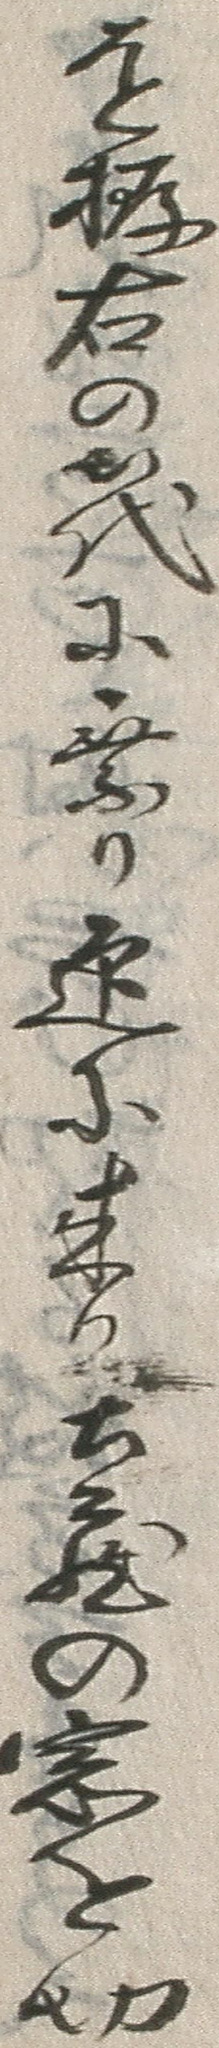を拵右の筏に乗り迎に来り土蔵の窓を切
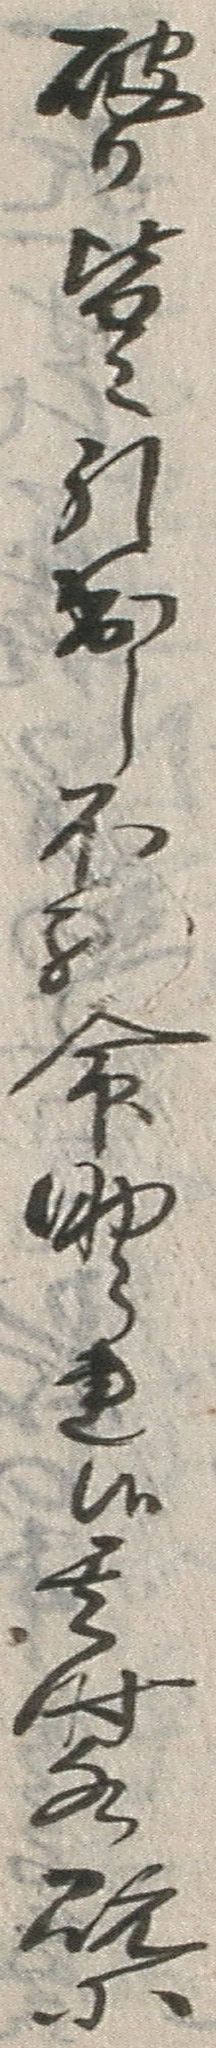破り皆々引出し不残命助られ候其時水既に
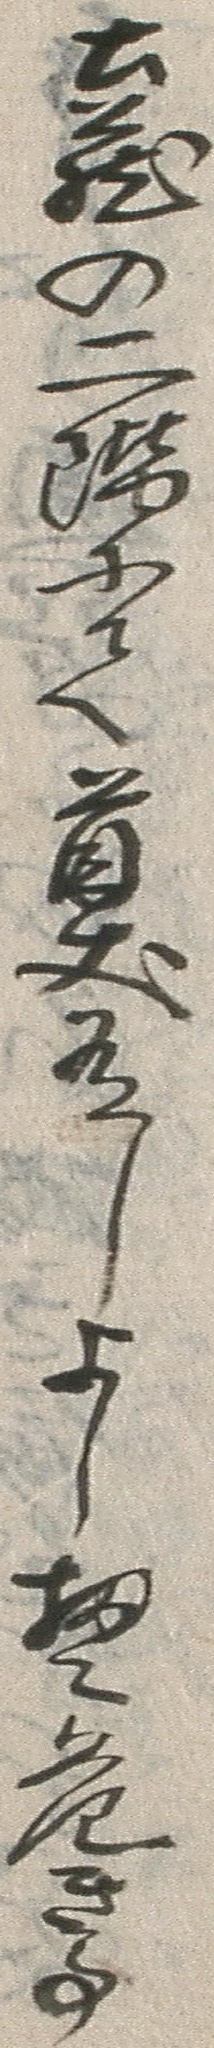土蔵の二階にて首丈有しよし扨々危き事
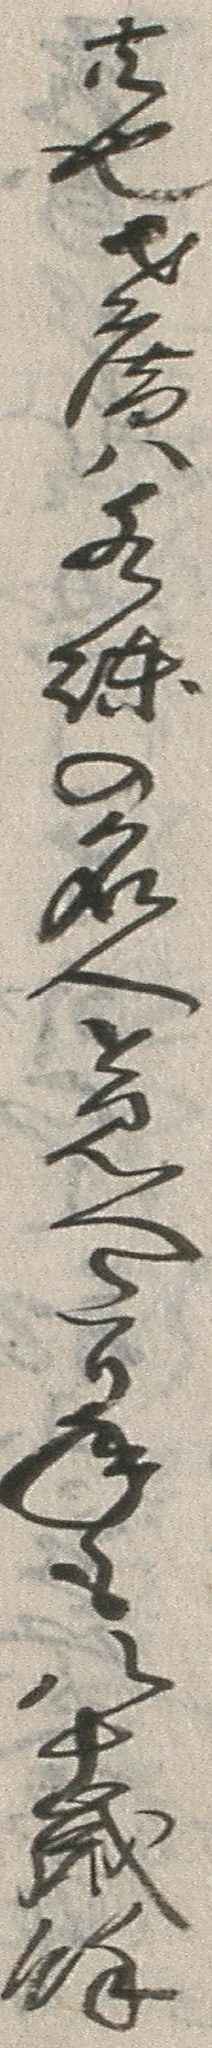共也才庵は水練の名人と見へたり年も八十歳余
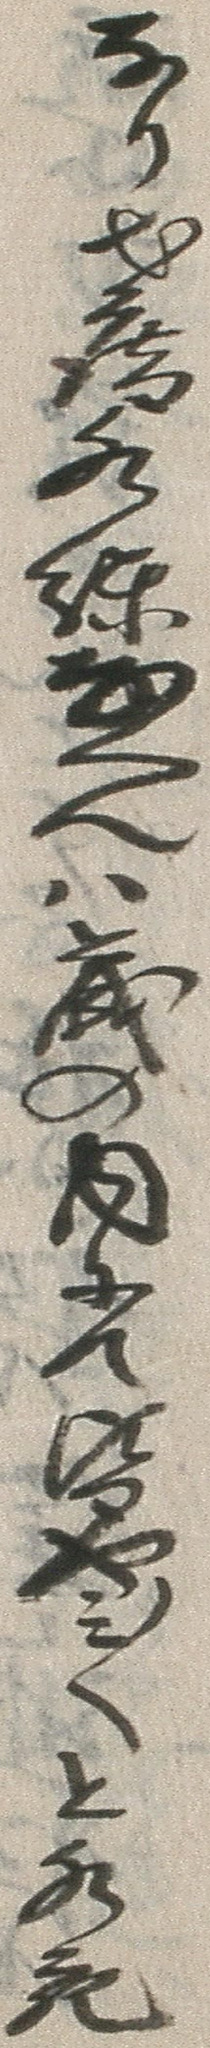なり才庵水練なくんは蔵の内にて皆やミ〳〵と水死
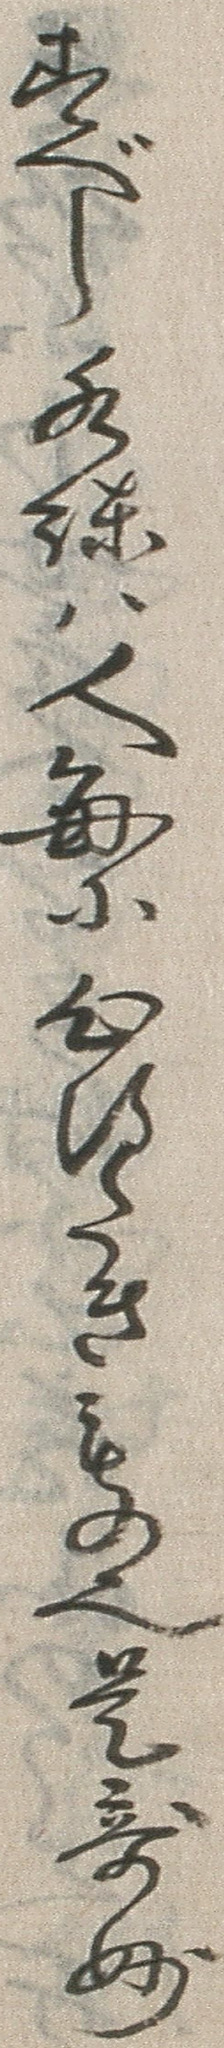すべし水練は人毎に心得たきもの也是奇妙
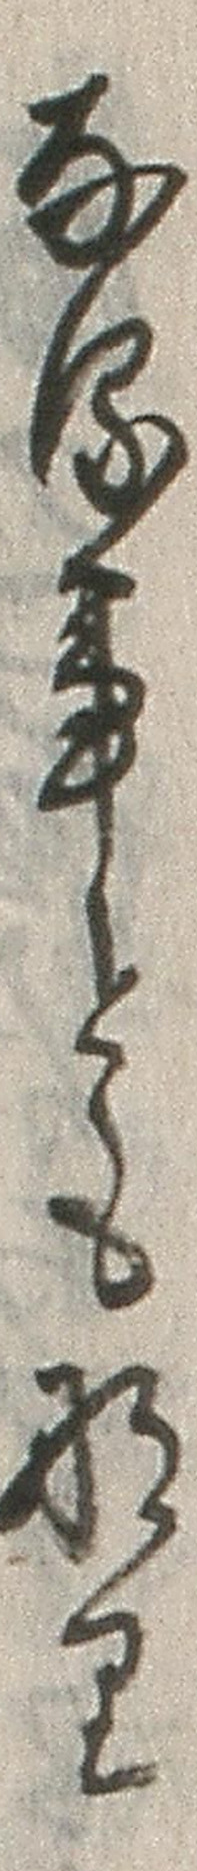なる事ともなり
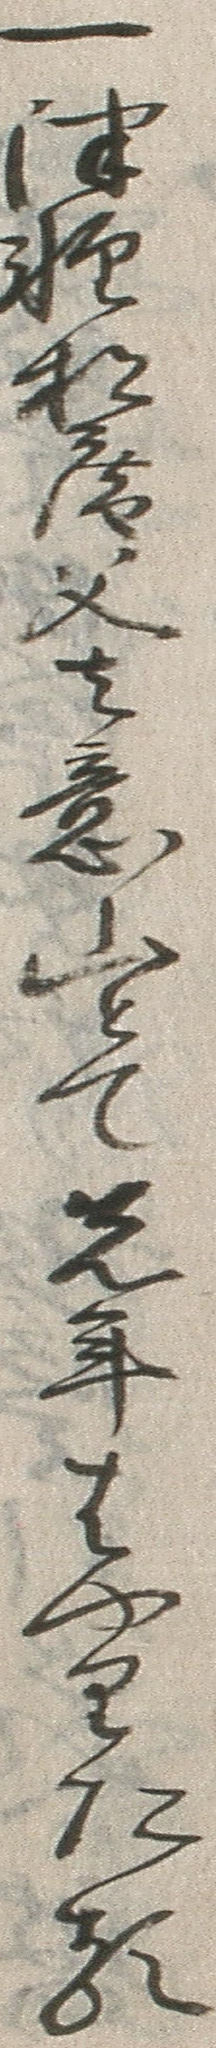一津軽松庵父は意山とて先年はやりたる
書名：享保十三年江戸洪水記
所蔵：東京大学地震研究所図書室 Earthquake Research Institute Library, The University of Tokyo, JAPAN
